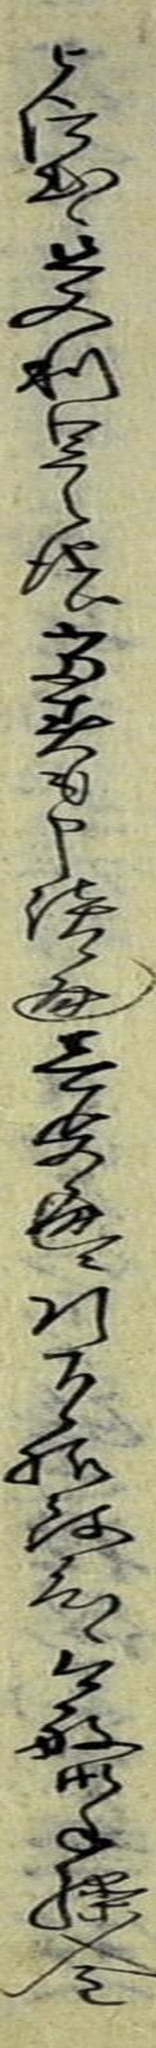被仰出候且又利足之儀ハ当春も申談候通壱歩通ニ引下候様致度候今般御手繰金
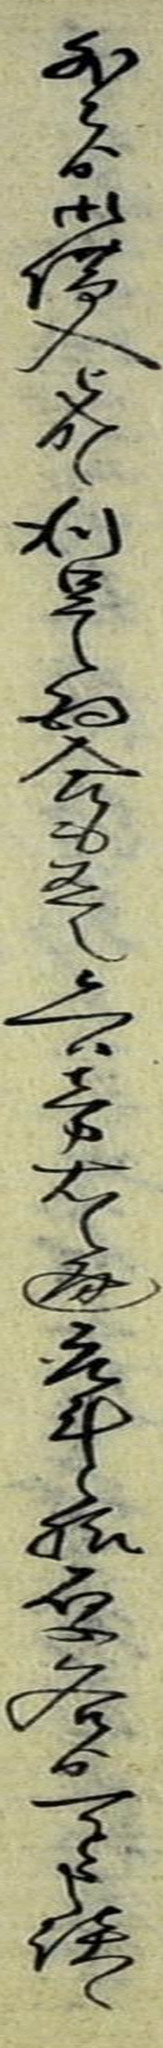外々ゟ御借入被成候利足之釣合も有之候ヘハ旁右之通取計候様厚各ゟ可被申談候
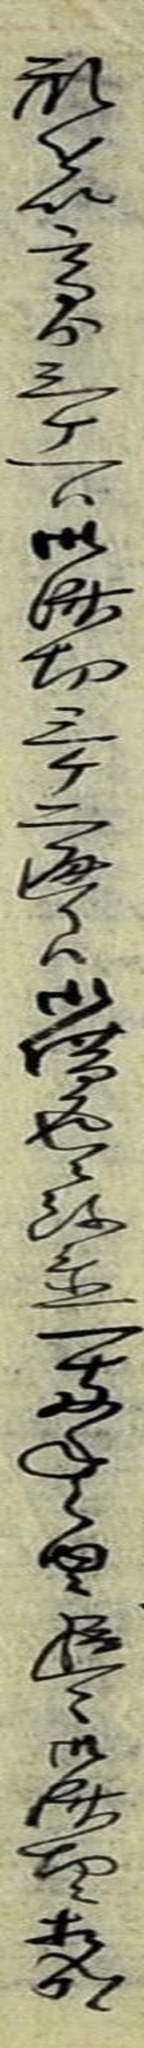形を以高ゟ三ケ一ハ御済切三ケ二通りハ御借返ニ致置一両年之内ニ追々御済切ニ相成候
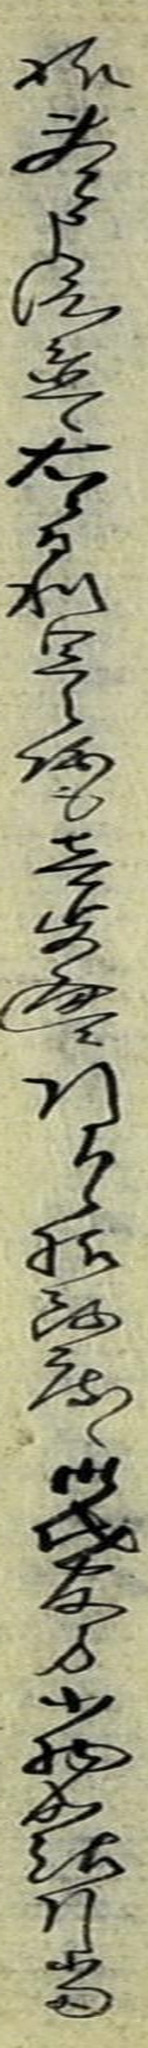様夫々申渡置候右ニ付利之儀も壱歩通ニ引下候様致度候御代官方小物成銀引当
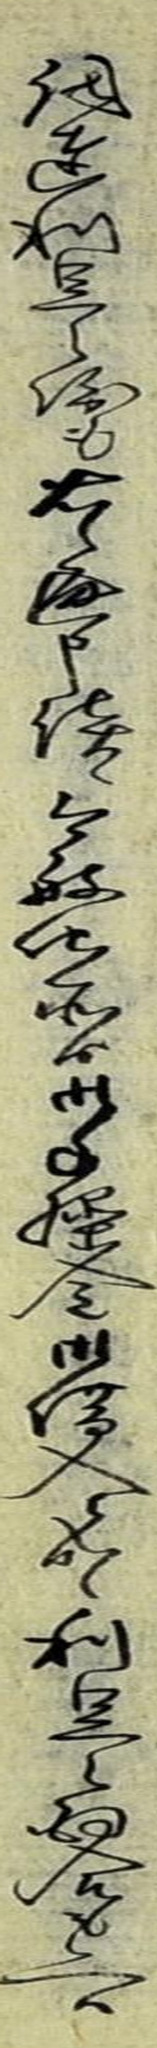調達利足之儀も右之通申談候今般他所ゟ御手繰金御借入被成候利足之釣合も候ヘハ
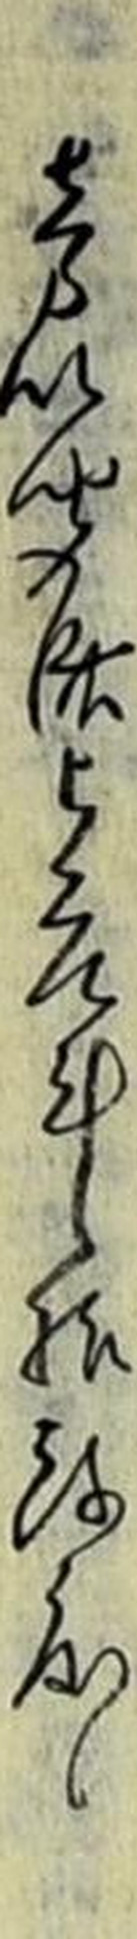旁以聞済被取計候様致度候

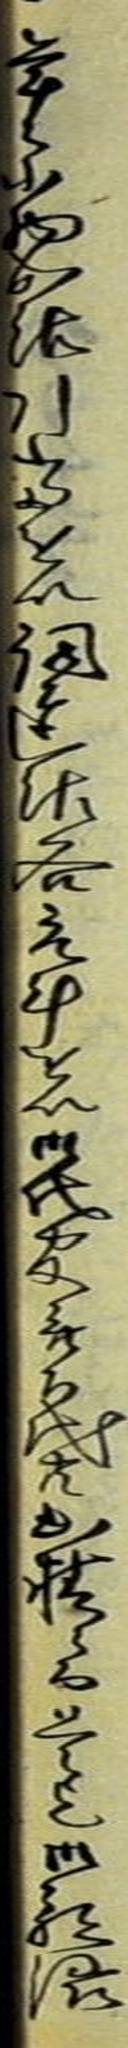〇年々小物成銀引当を以調達銀各取計を以御代官并下代共出精ニ而是迄御難渋
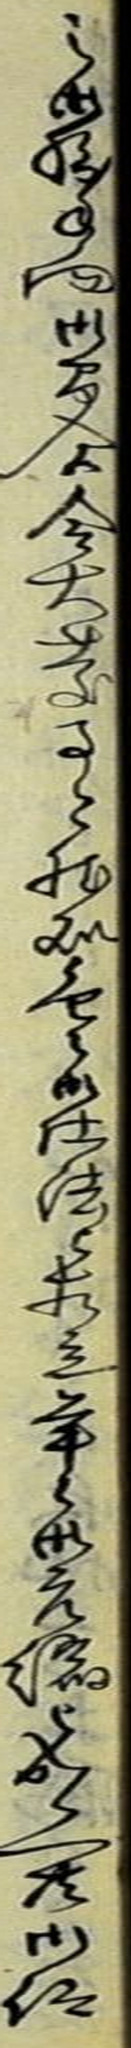之御勝手向御間合令大慶事ニ候然処色々御仕法被相立年々御取縮被成候へ共御跡

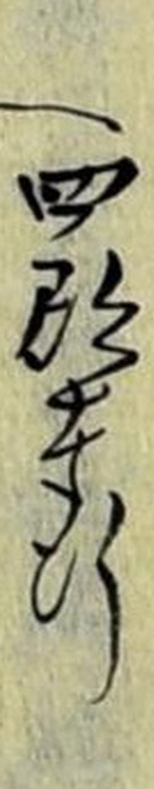四郡奉行
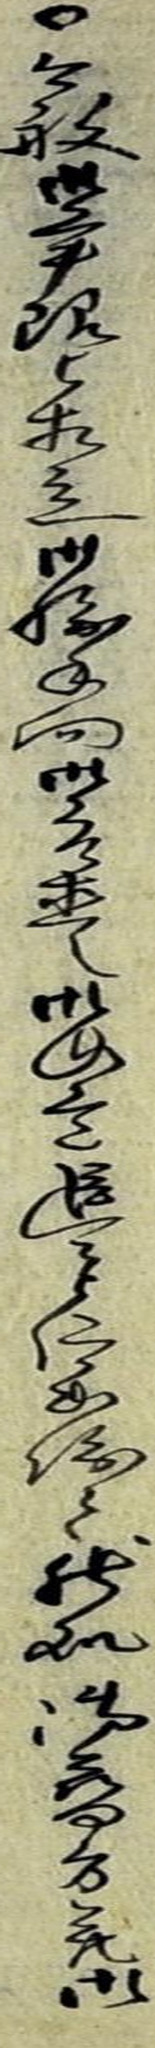〇今般御年限被相立御勝手向御取直之御趣意追々被仰出儀ニ候然処御暮方并御
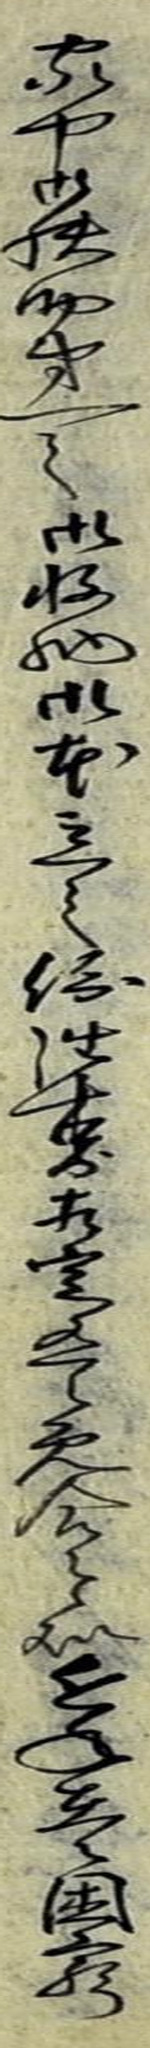家中御扶助第一之御収納御本立之儀往古ゟ相定有之免合ニ候処近年在々困窮
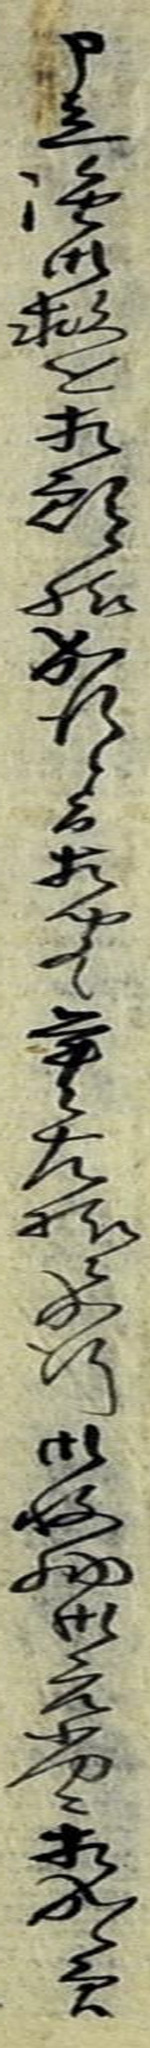申立強御救を相願候様成行候旨相聞候年々左様ニ成行御収納御取劣ニ相成候而ハ
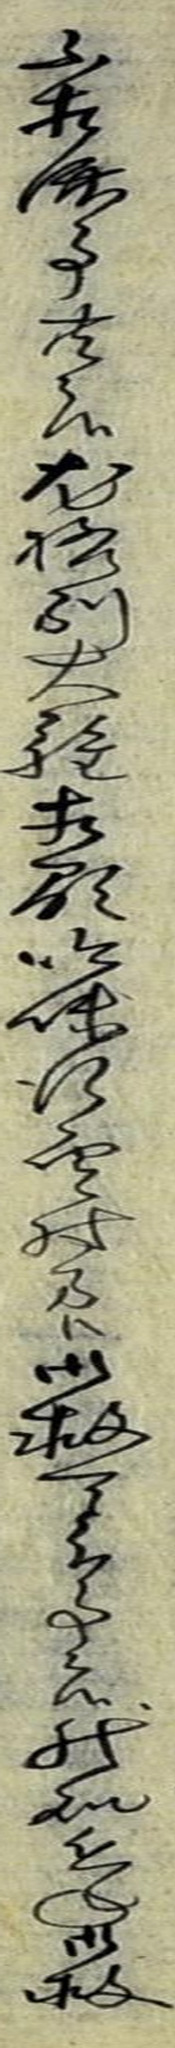不相済事共ニ候尤格別大難相顕吟味行届候村方ハ御救可被下事ニ候然処近年御救
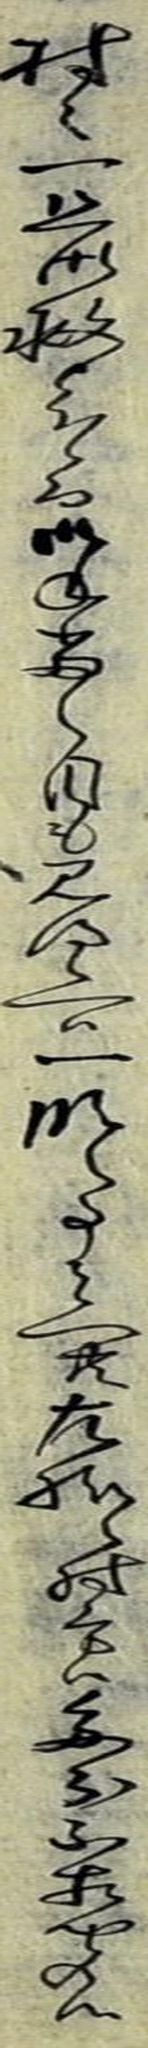村々一旦御救被下候而御手当之目も見得候ヘハ一段之事ニ候へ共左様之村方ハ多分不相聞候
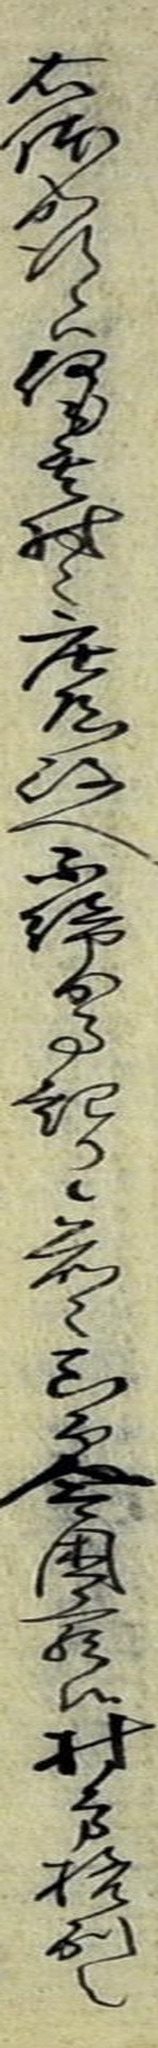右体成行候ハ何分共村々庄屋役人不締ゟ事起り候前々至而令困窮候村方格別之
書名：命令之部 三
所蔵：福井県文書館 Fukui Prefectural Archives
